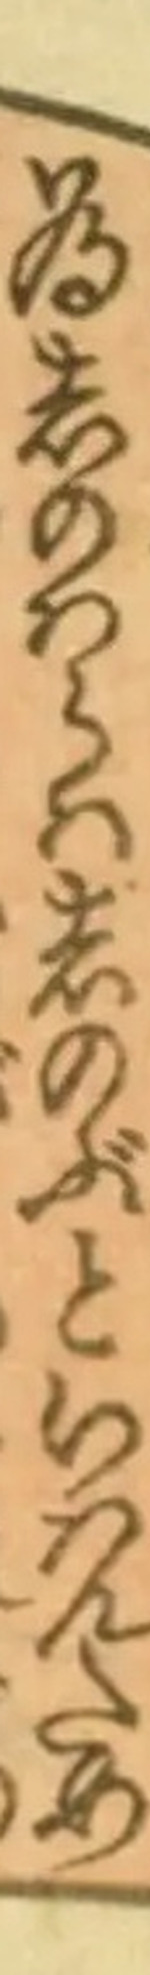爲しのはらはしのぶといはんため
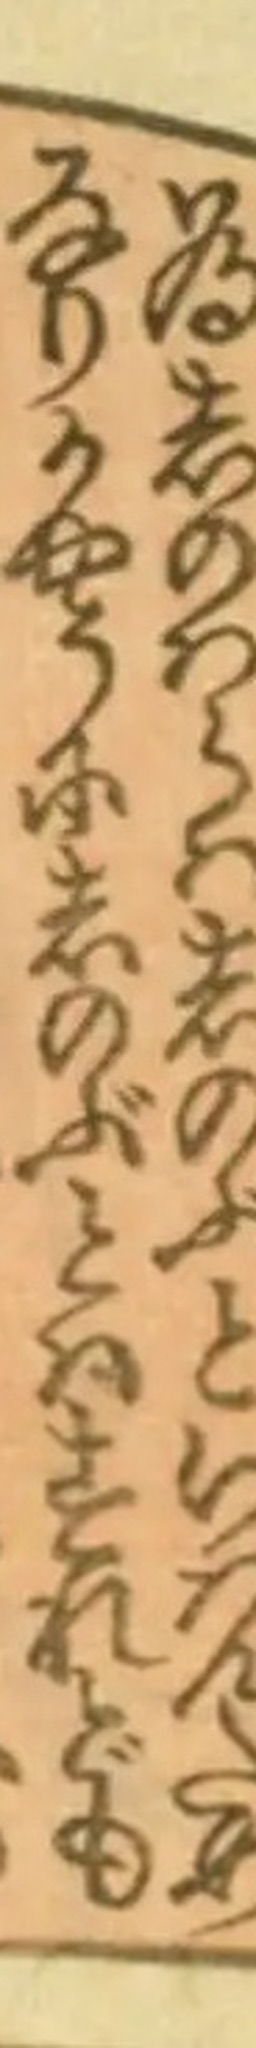なりかやうにしのぶとはすれども
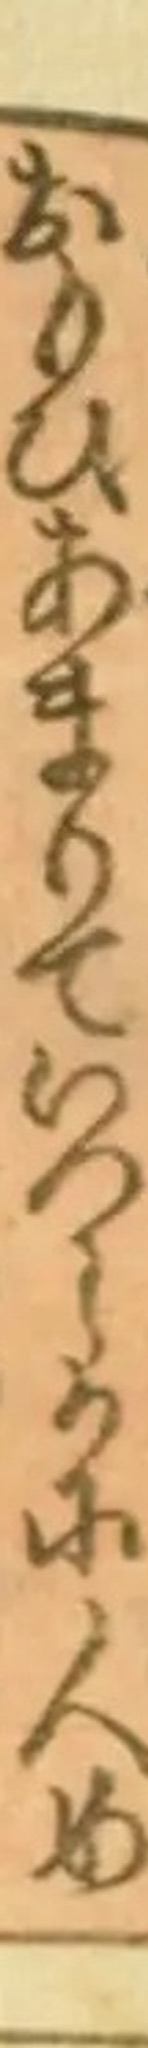おもひあまりていつしかに人め
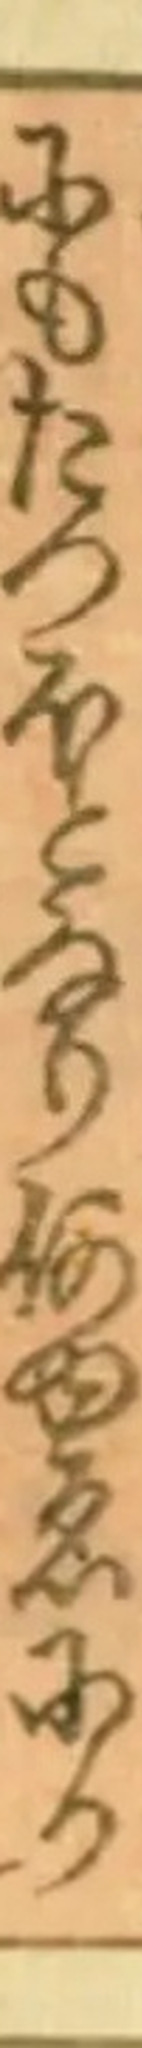にもたつほとなり何ゆゑにか
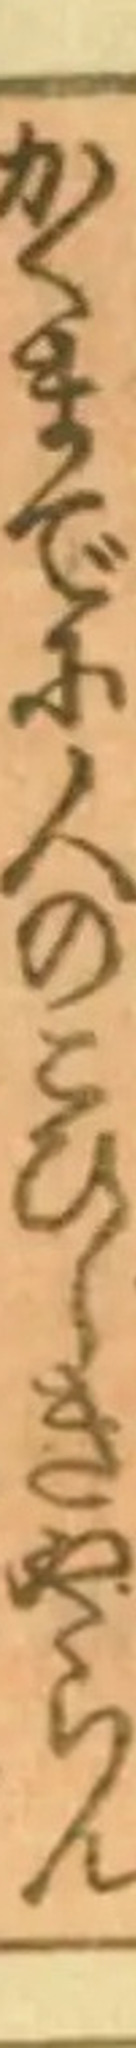かくまでに人のこひしきやらん
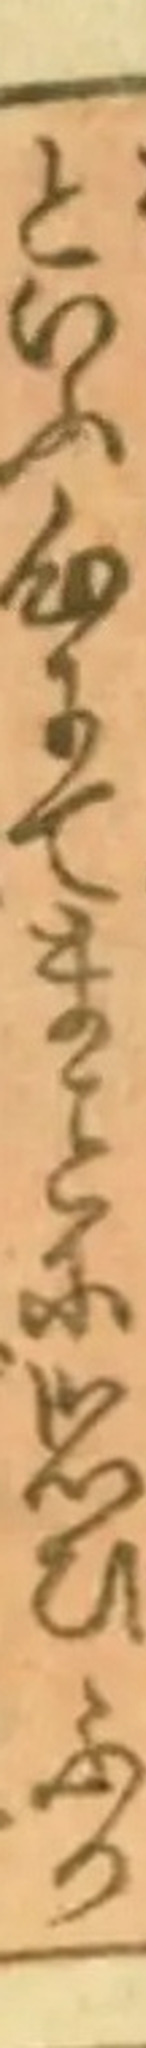といふ心にてまことに思ひふか
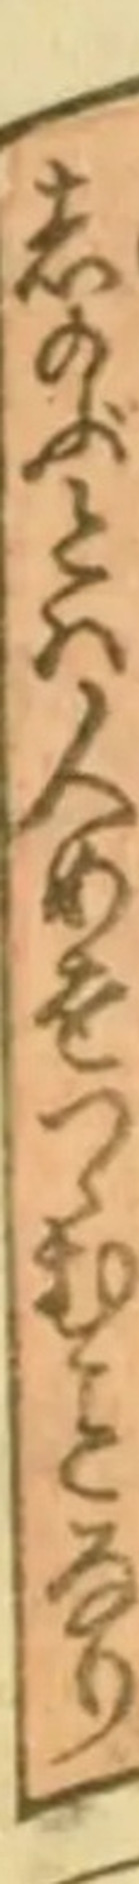しのぶとは人めをつゝむことなり
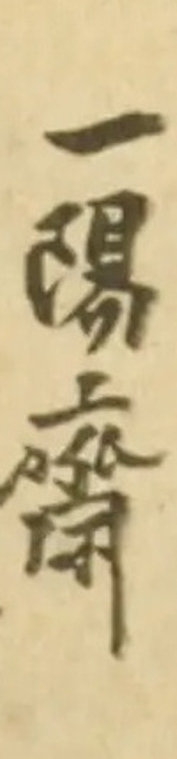一陽斎
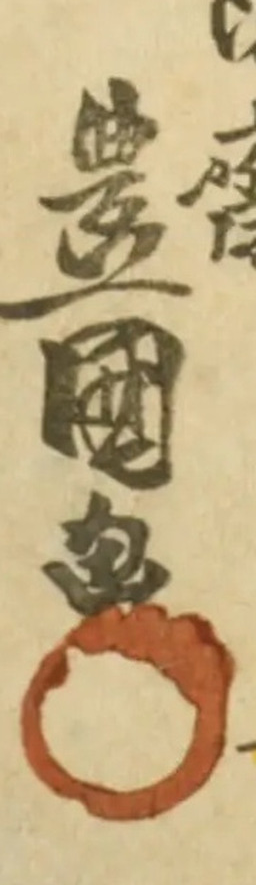豊国画
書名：三十九ばん　参議等
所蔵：国立国会図書館 National Diet Library, JAPAN
